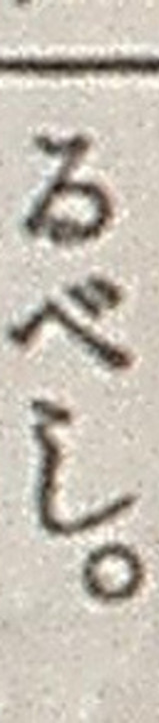るべし。
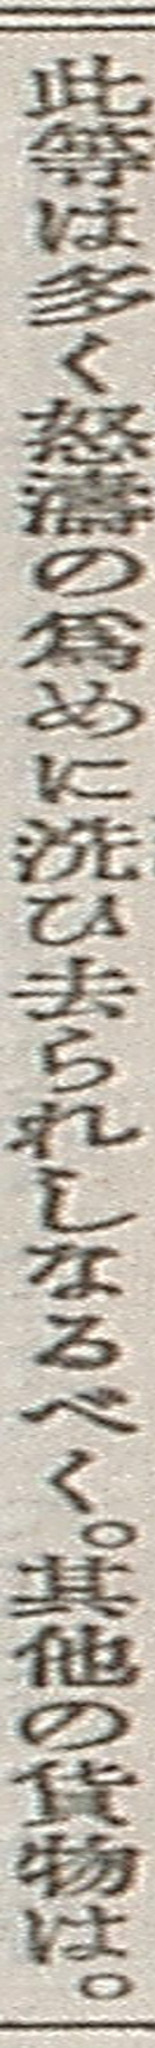此等は多く怒濤の為めに洗ひ去られしなるべく。其他の貨物は。
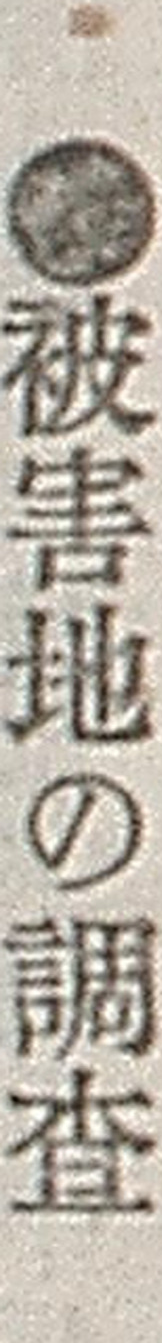●被害地の調査
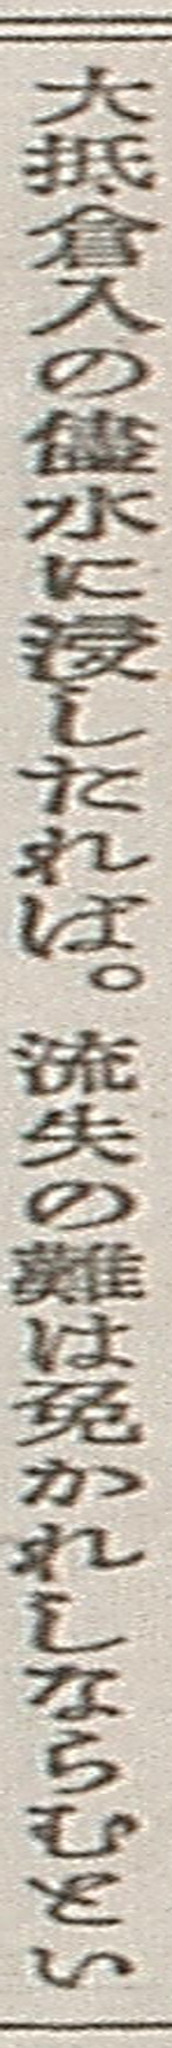大抵倉入の侭水に浸したれば。流失の難は免れしならむとい
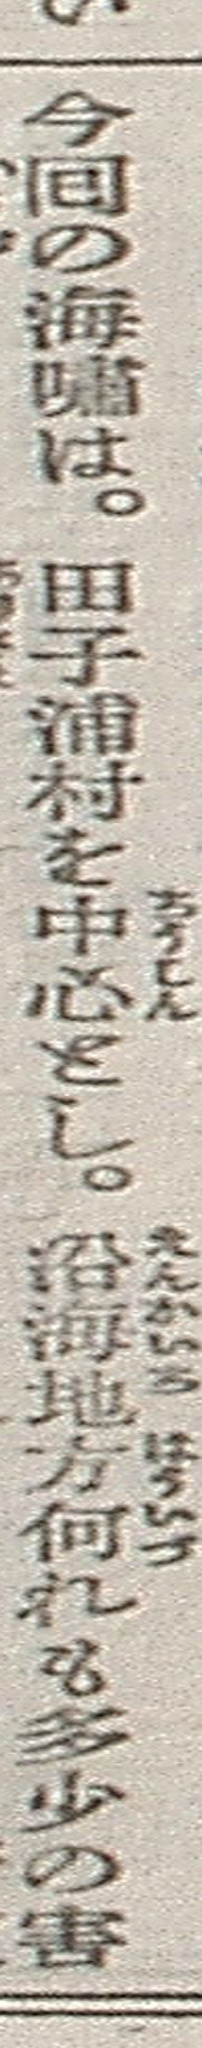今回の海嘯は。田子浦を中心とし。沿海地方何れも多少の害
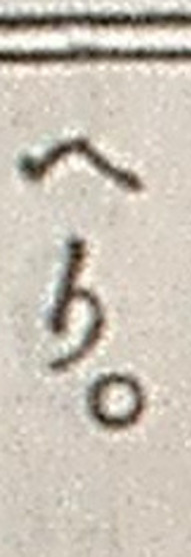へり。
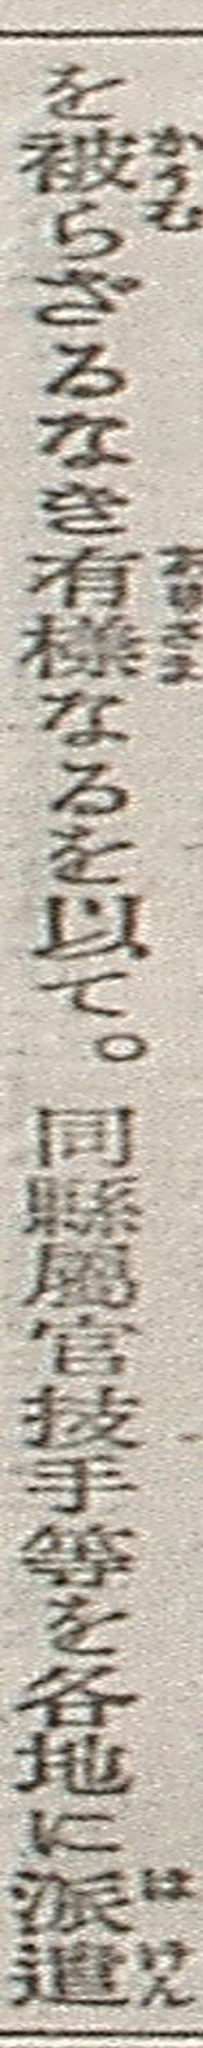を被らざるなき有様なるを以て。同県属官技手等を各地に派遣

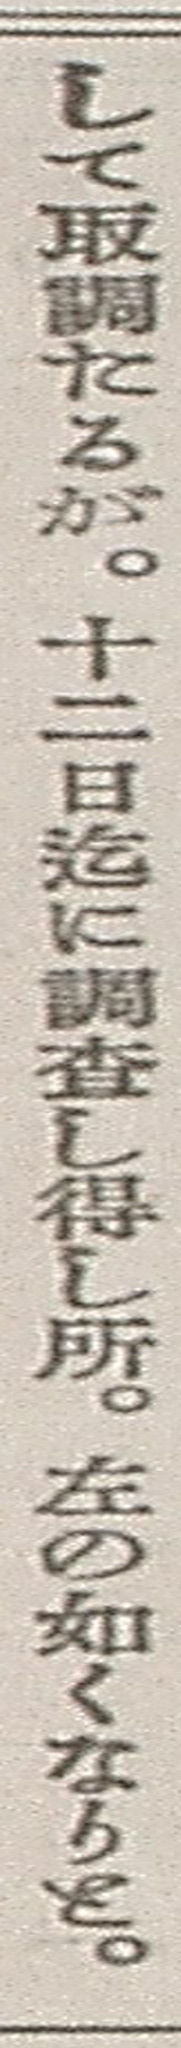して取調たるが。十二日迄に調査し得し所。左の如くなりと。
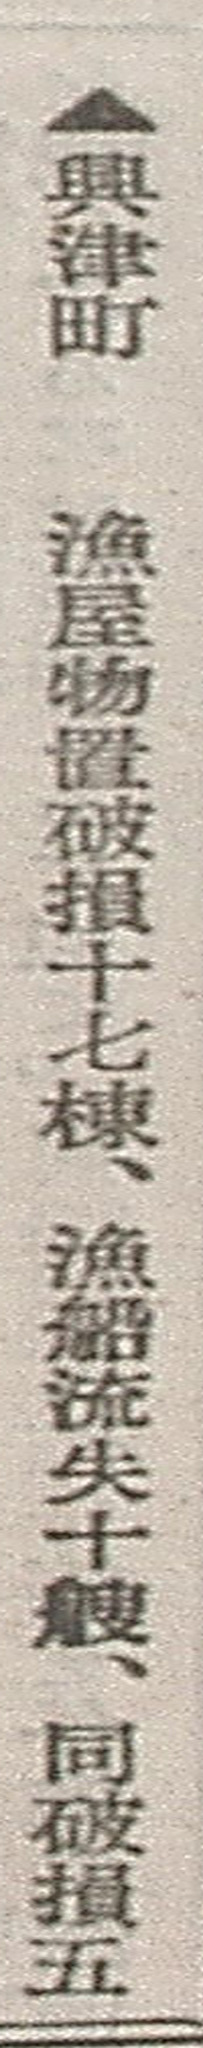▲興津町漁屋物置破損十七棟、漁船流失十艘、同破損五
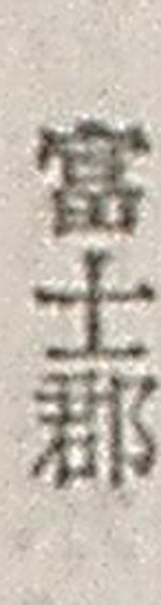富士郡
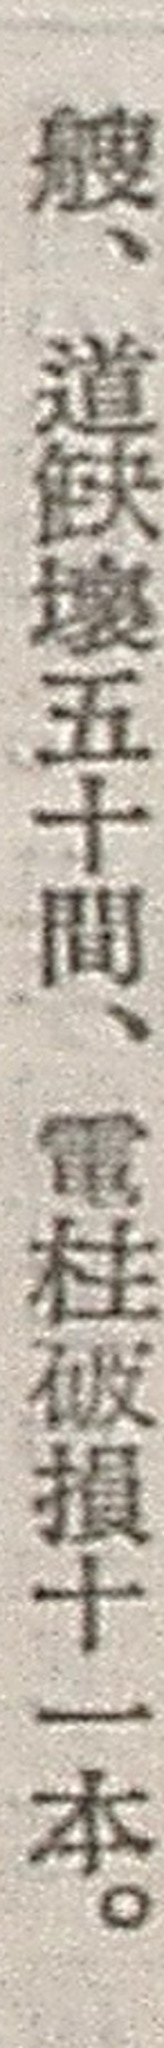艘、道決壊五十間、電柱破損十一本。
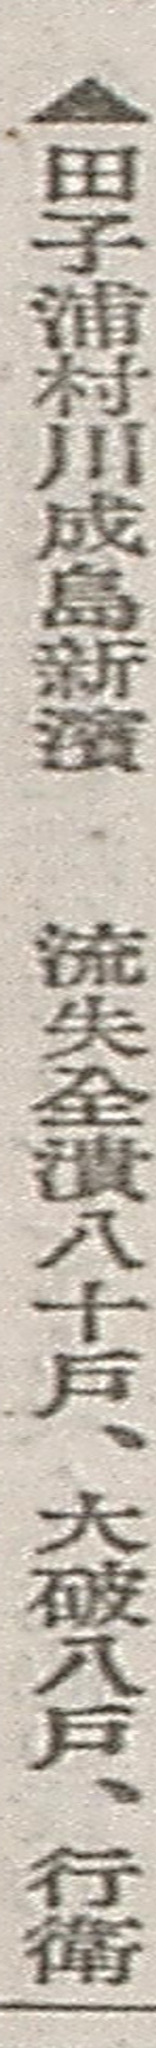▲田子浦村川成島新浜流失全潰八十戸、大破八戸、行衛
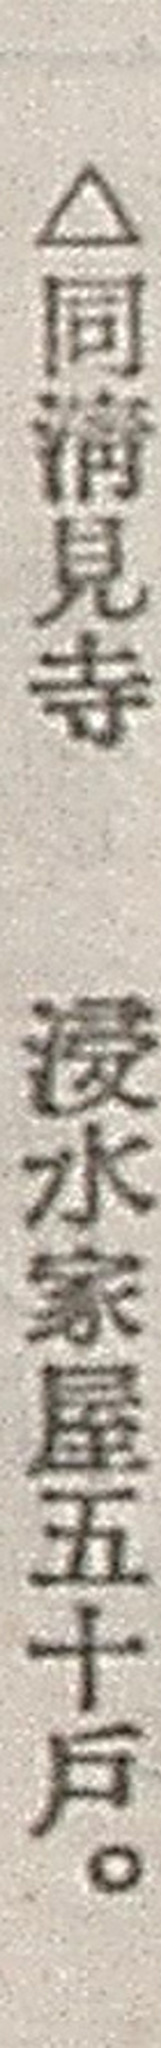△同清見寺浸水家屋五十戸。
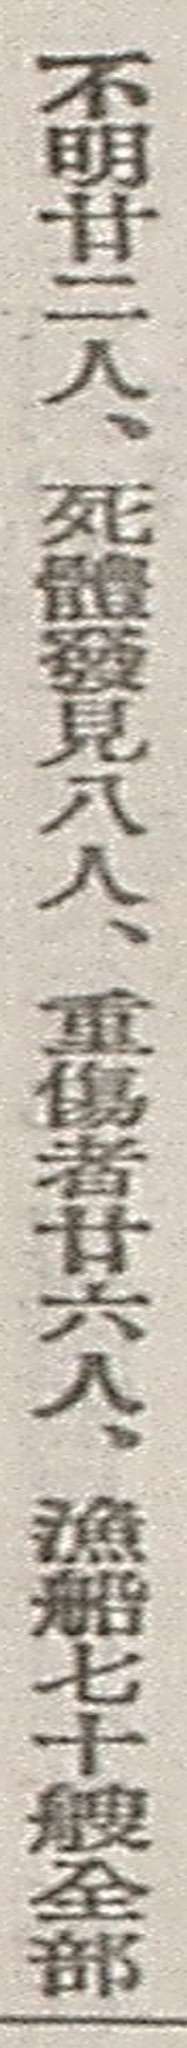不明廿二人、死体発見八人、重傷者廿六人、漁船七十艘全部
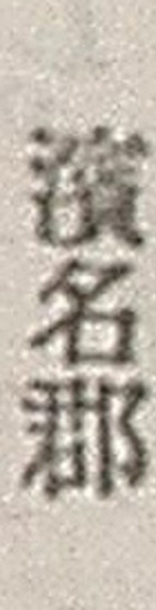浜名郡
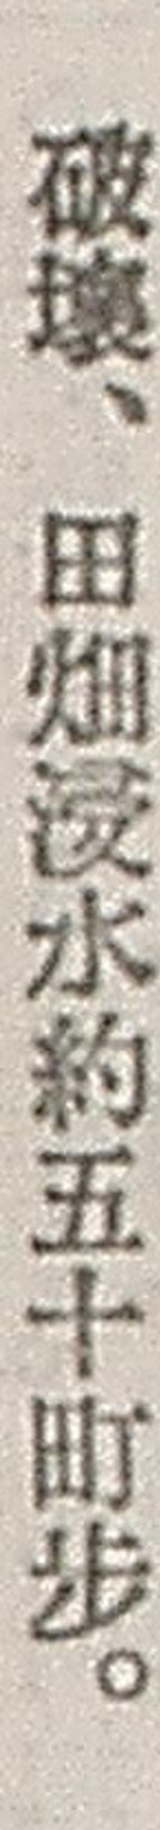破壊、田畑浸水約五十町歩。
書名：風俗畫報臨時増刊第百九十九號　明治三十二年十月各地災害圖會（前編之續）
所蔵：東京大学地震研究所図書室 Earthquake Research Institute Library, The University of Tokyo, JAPAN
